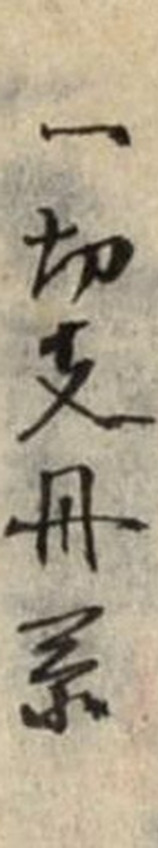一切支丹系

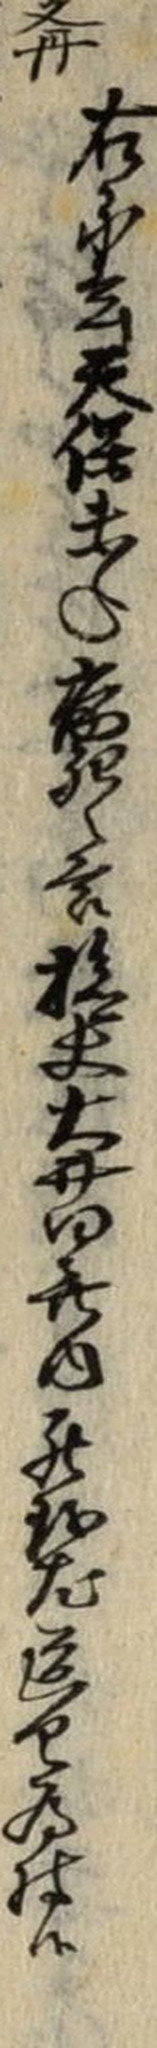右永玄天保未年病死之節検使大井田喜内罷越尤道具為持候
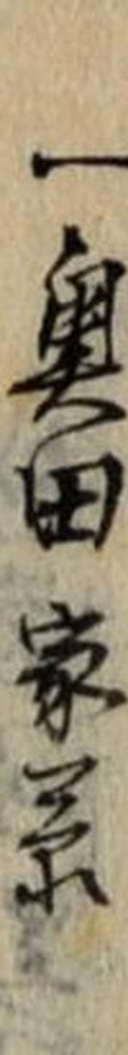一奥田家系
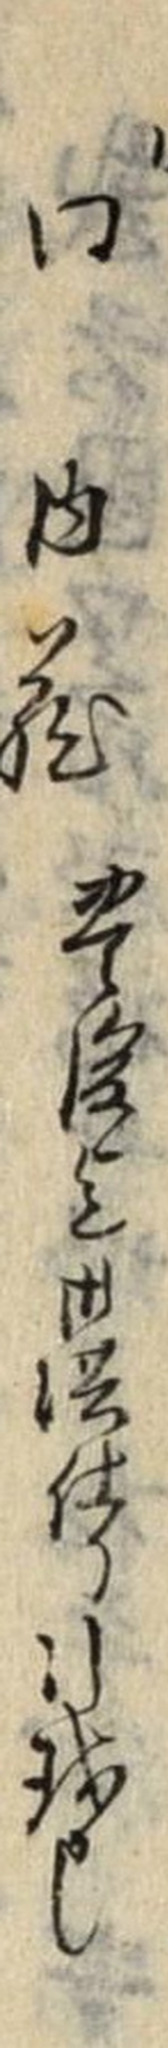同内蔵豊後迄御供仕り引越申候
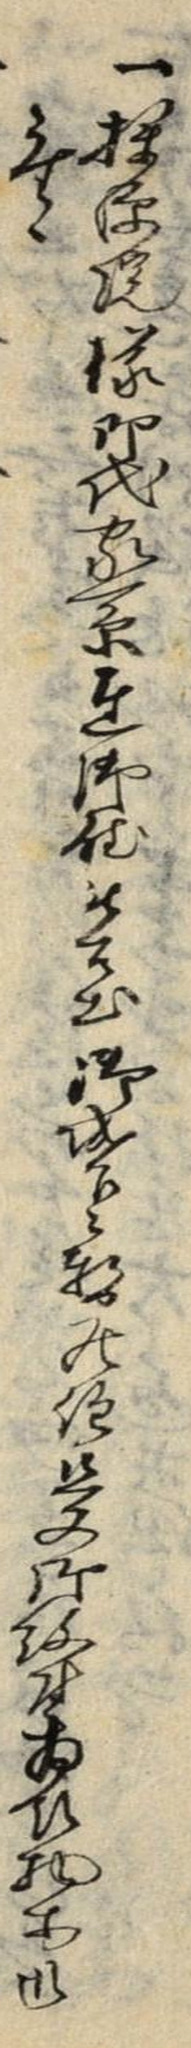一探源院様御代家系達御聴被召出御城下に暫居住且又御紋付拝領物等御
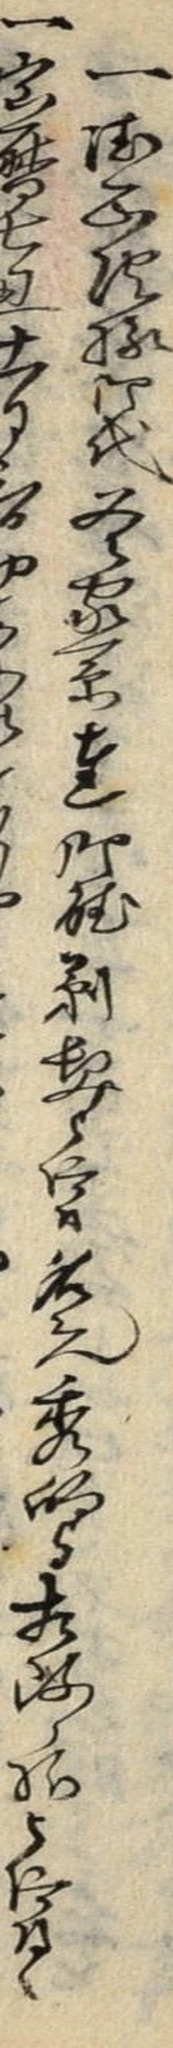一徳正院様御代又々家系達御聴剃髪被仰付名元秀的と相改候様被仰付候
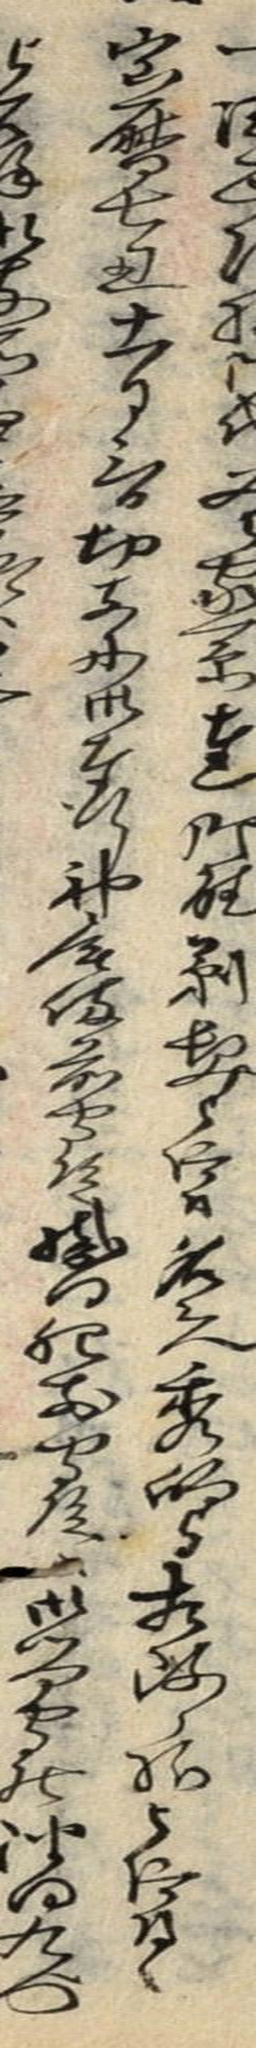一宝暦七丑十一月三日切支丹御奉行神尾備前守殿織田肥前守殿御留守居津田九右衛門
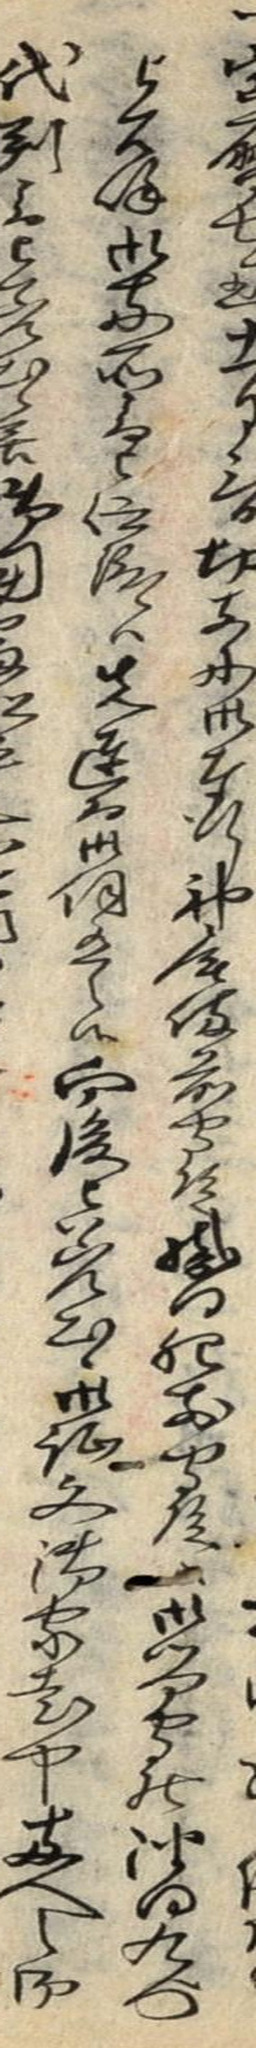被召呼御両所にて被仰渡候は先達て御伺有之候向後被差出候御証文御家老中両人之御
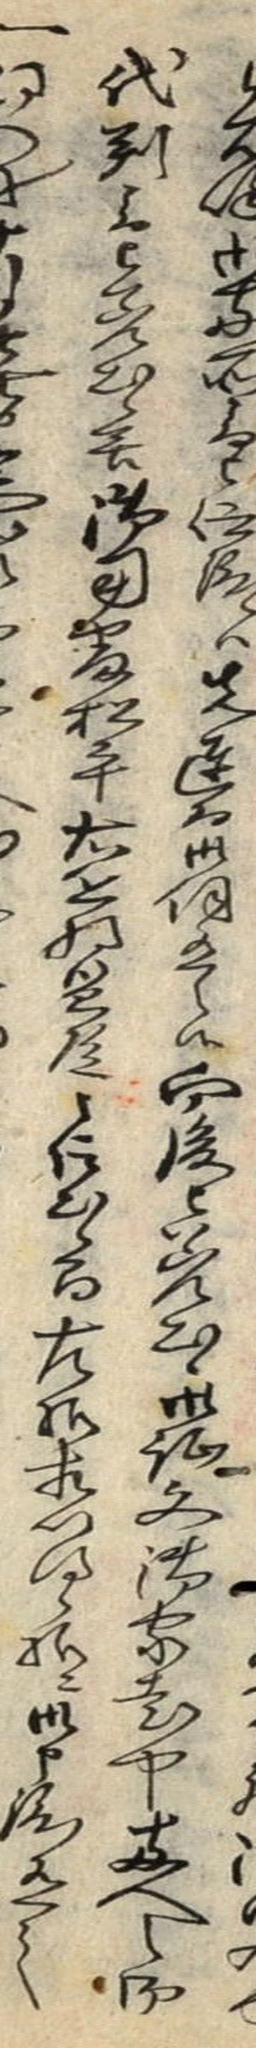代判にて被差出候筈御用番松平右近将監殿被仰出候間左様相心得候様に御申渡有之
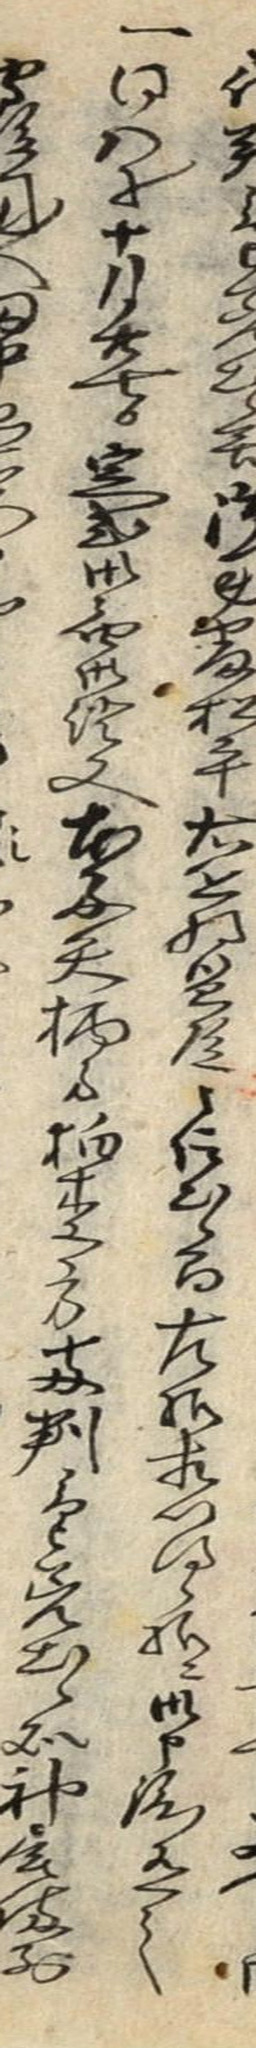一同八刁十月廿七日定式御届御証文本多矢柄方狛木工方両判にて被差出候処神尾備前
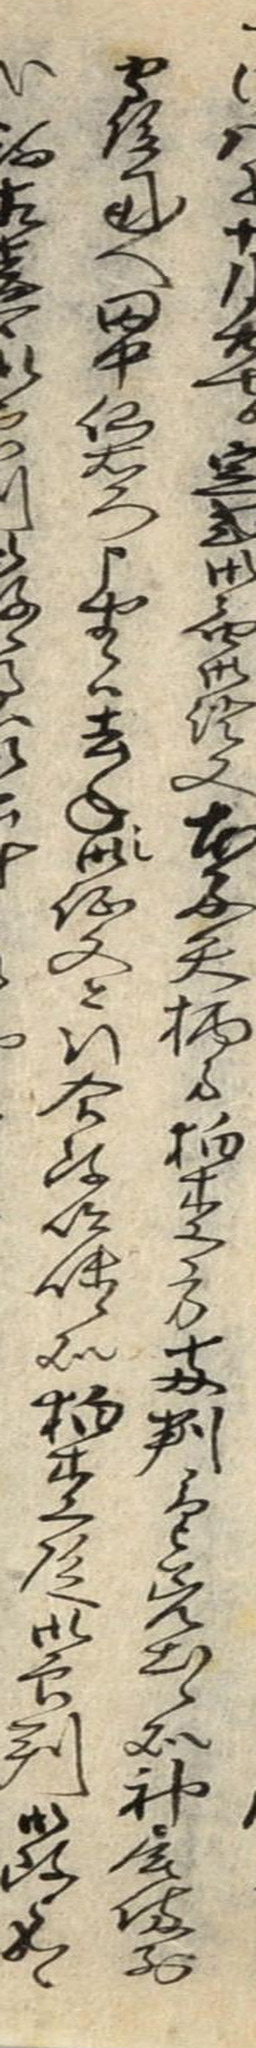守殿用人田中仙右衛門申聞候は去年之御証文と引合致吟味候処狛木工殿御印判御改被成候
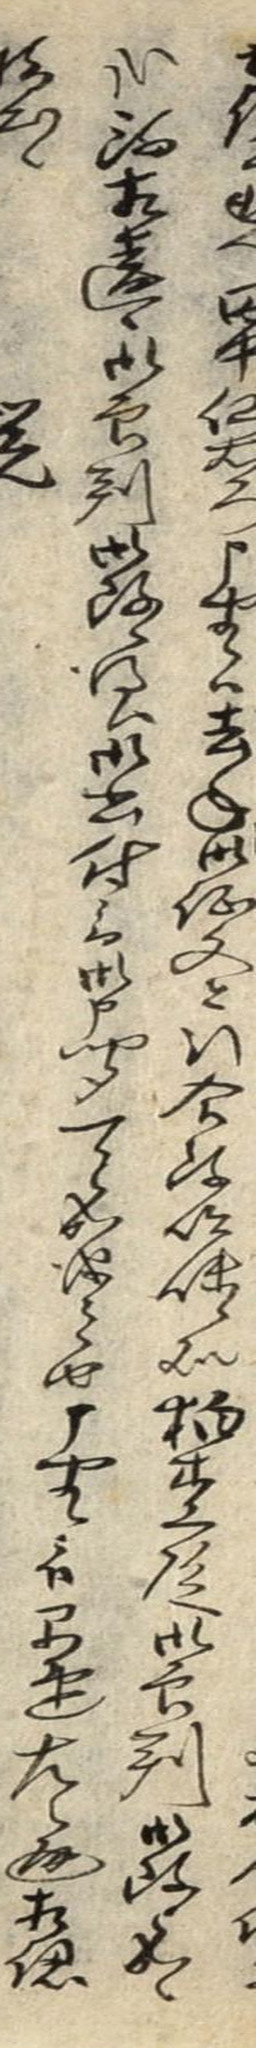哉致相違候御印判御改候得は御書付にて御申聞可被成儀に候由申聞候に付早速左之通相認
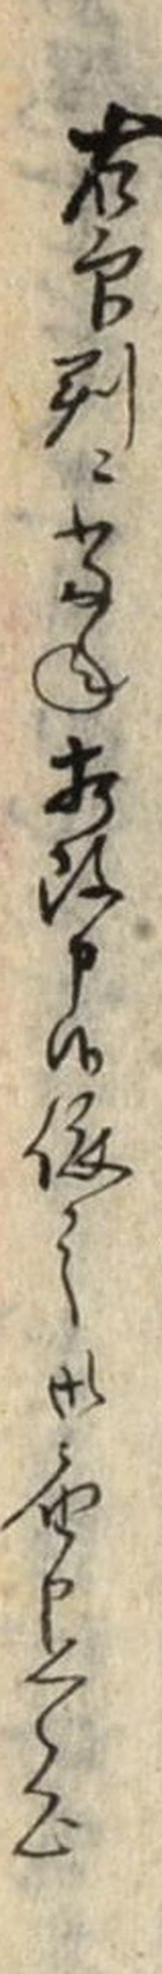右印判に当年相改申候依之御届申上候以上

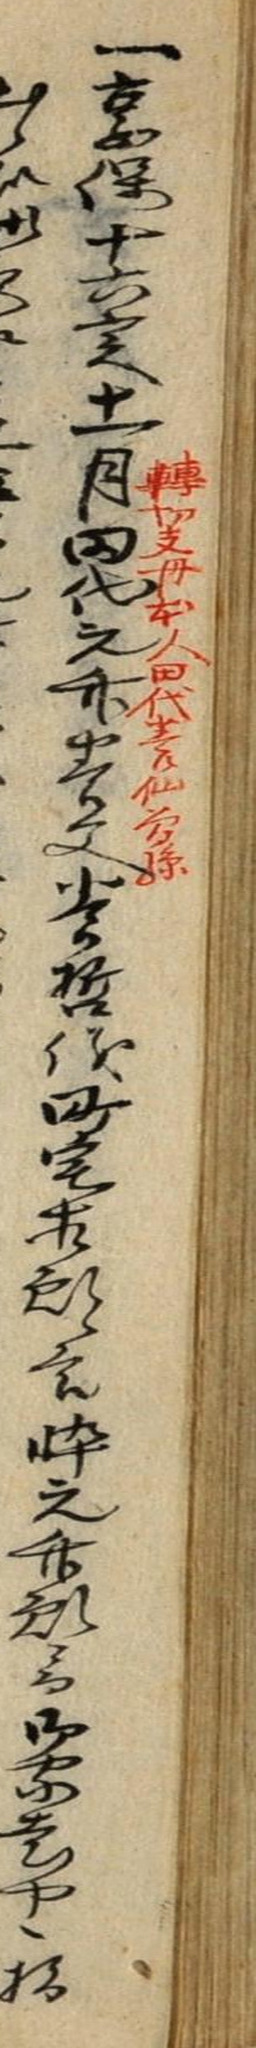一享保十六亥十一月田代元竹養父養哲儀町宅相願候節忰元竹願にて御家老中へ指
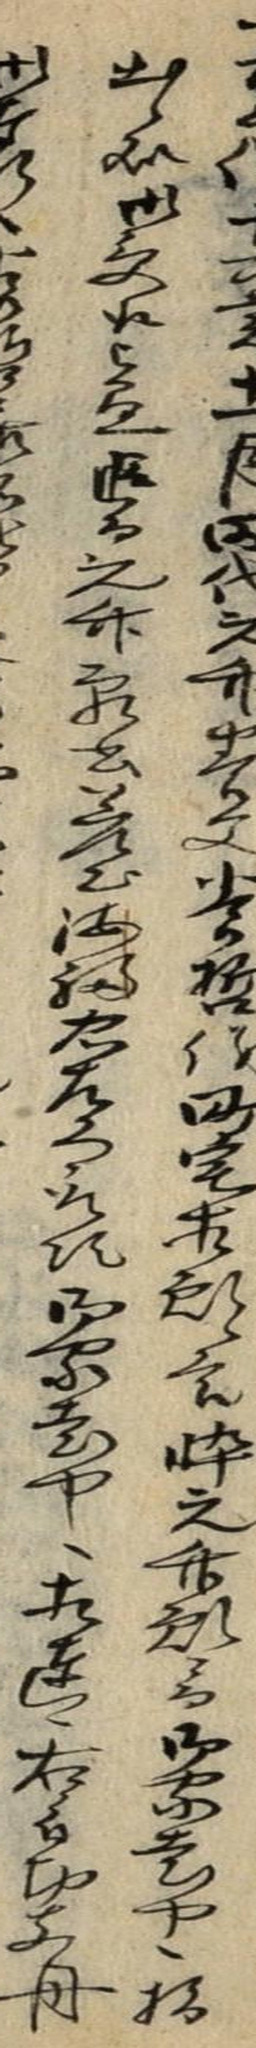出候処御受取被置追て元竹願書差出海福忠左衛門取次御家老中へ相達候右に付切支丹
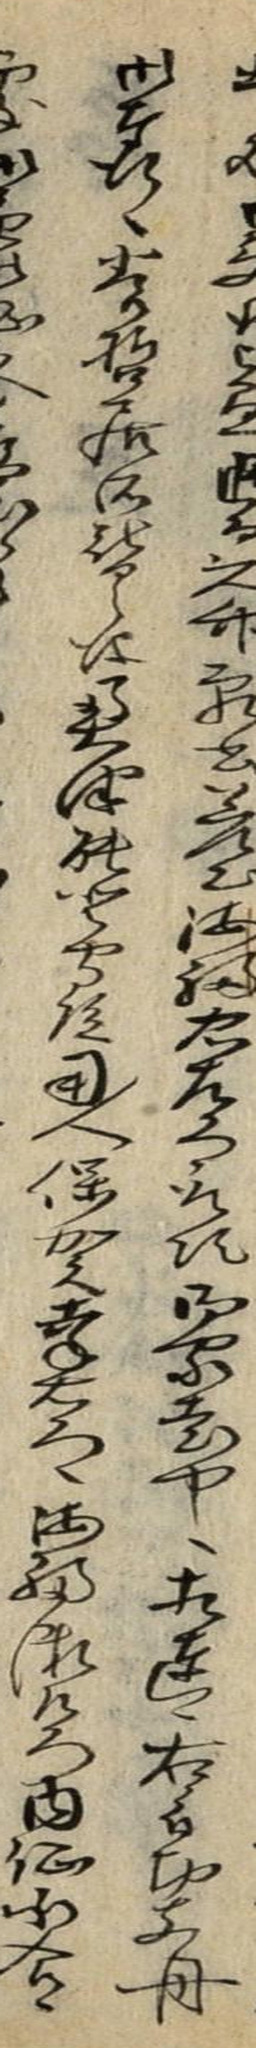御奉行へ養哲居所替之儀奥津能登守殿用人保賀幸右衛門へ海福瀬左衛門内証承合候
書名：御停止異変死失
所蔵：福井県文書館 Fukui Prefectural Archives
